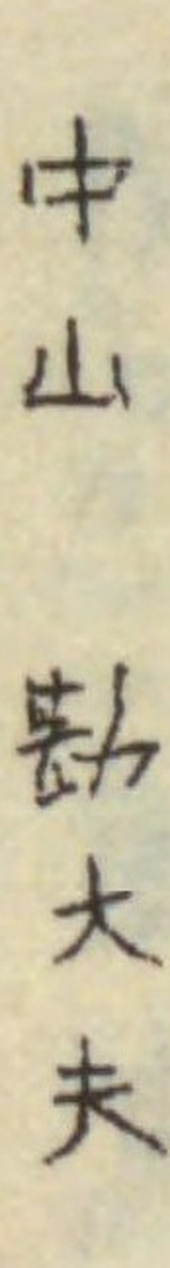中山勘太夫
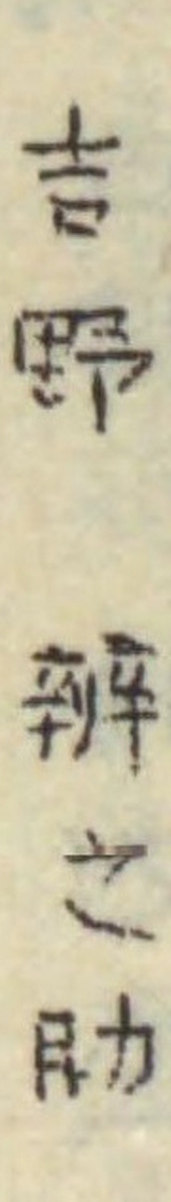吉野辨之助
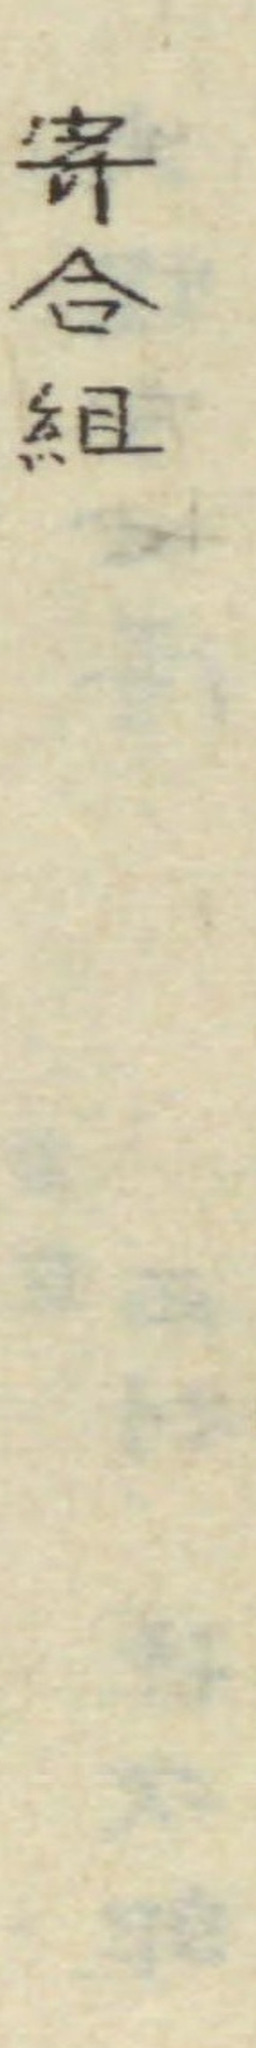寄合組
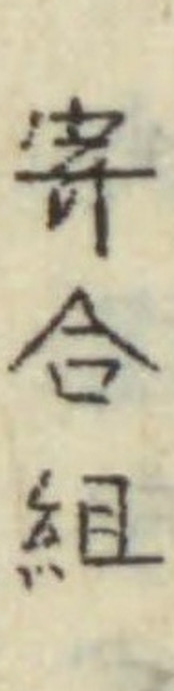寄合組
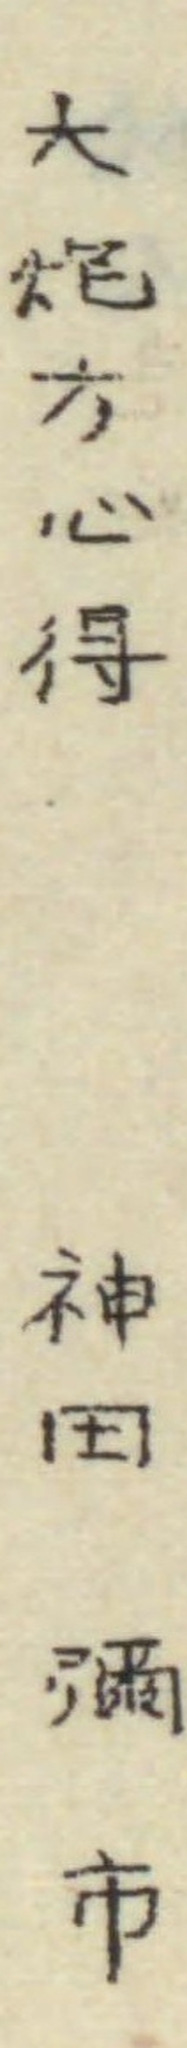大炮心得神田弥市
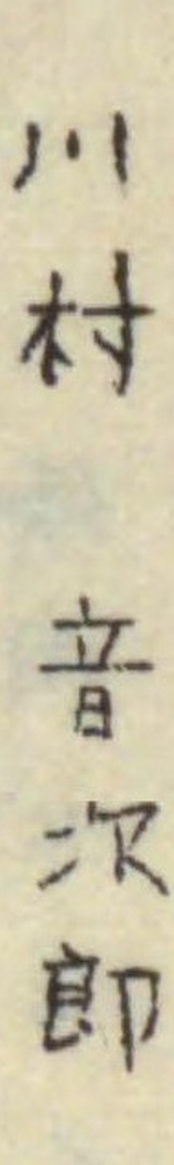川村音次郎
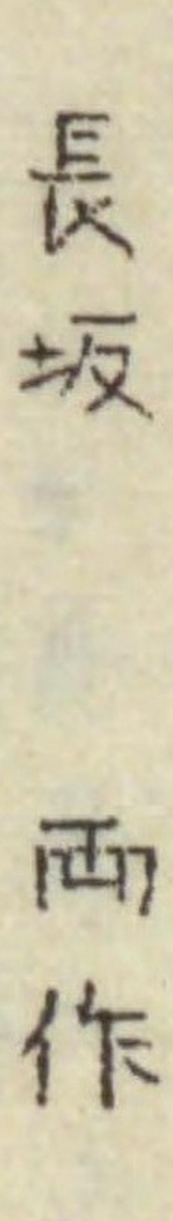長坂両作
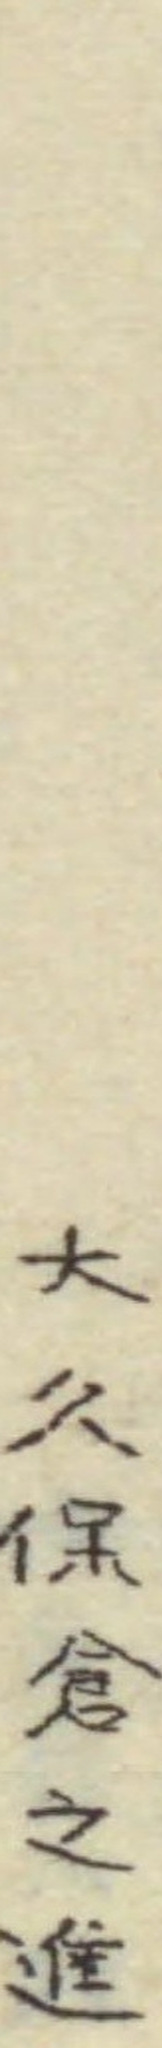大久保倉之進
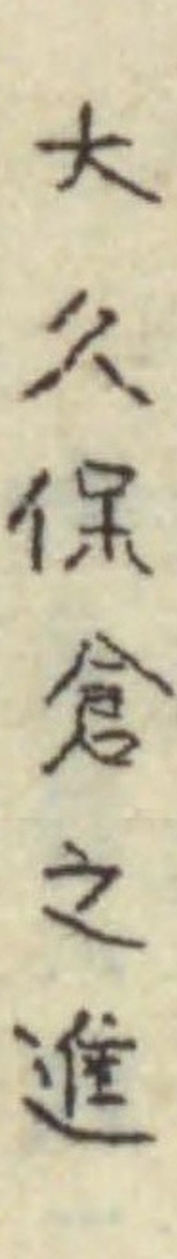大久保倉之進
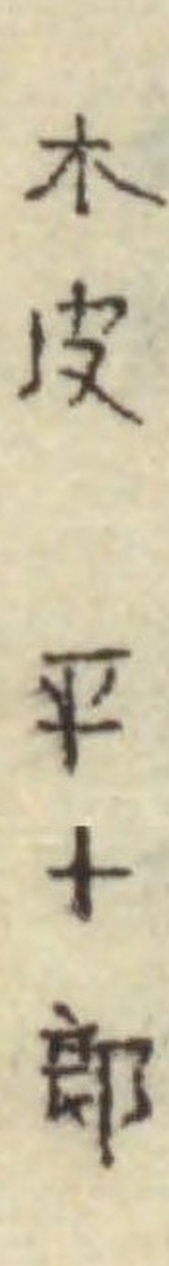木皮平十郎
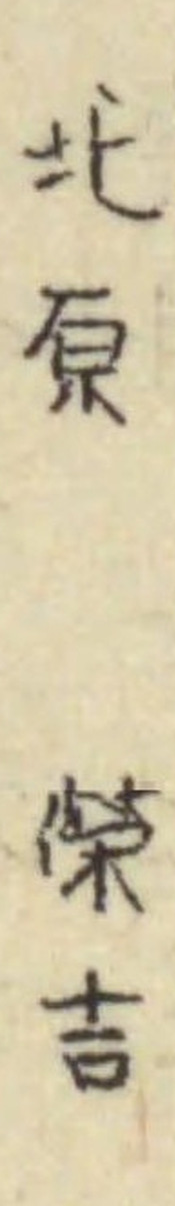北原栄吉
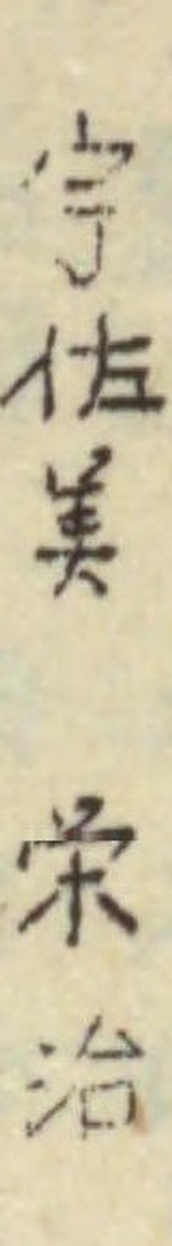宇佐美栄治
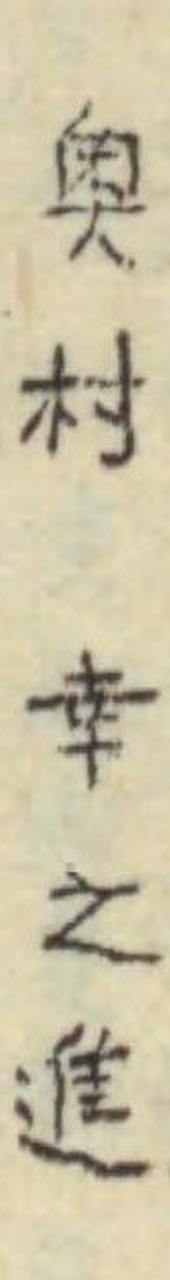奥村幸之進
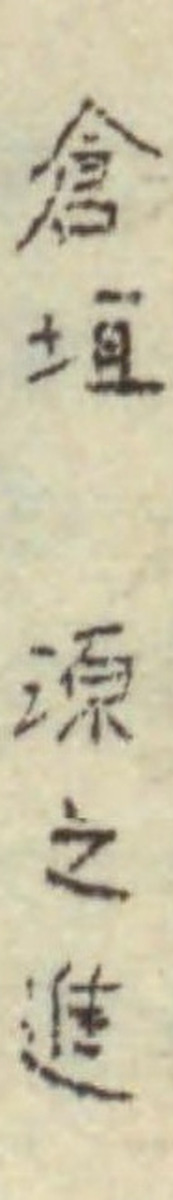倉垣源之進
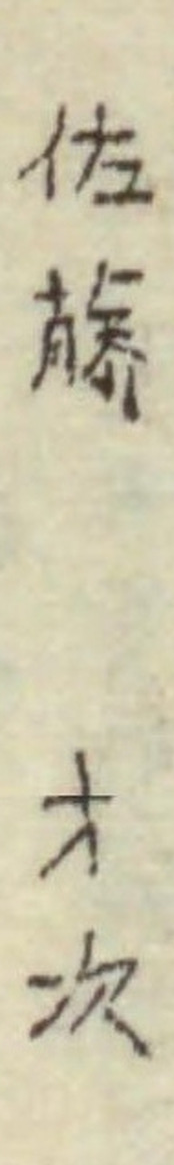佐藤才次
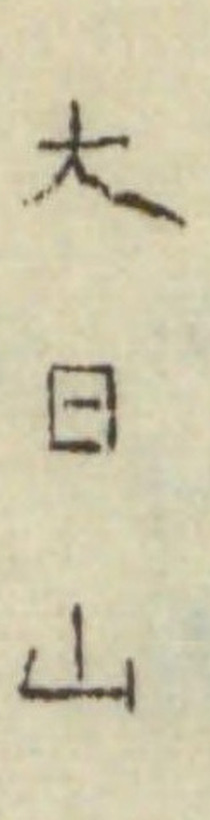大日山
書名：三河吉田藩動員史料
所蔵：国立国会図書館 National Diet Library, JAPAN
